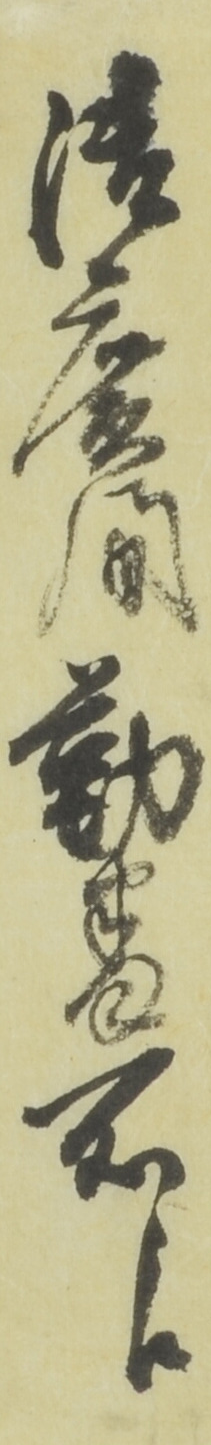御広間勤番所江
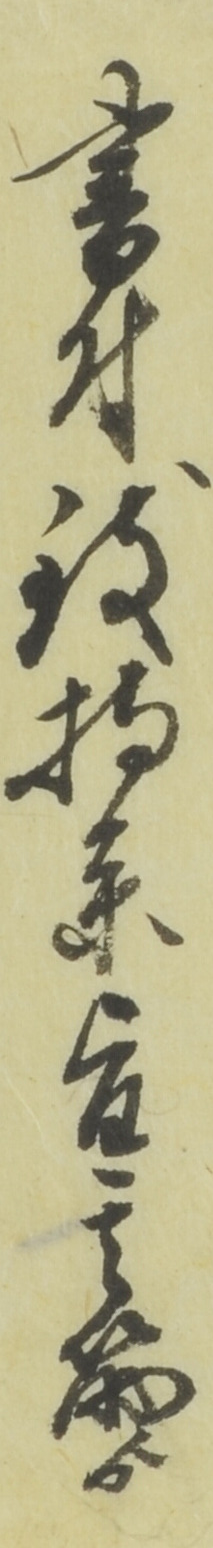書付致持参旨其筋ゟ
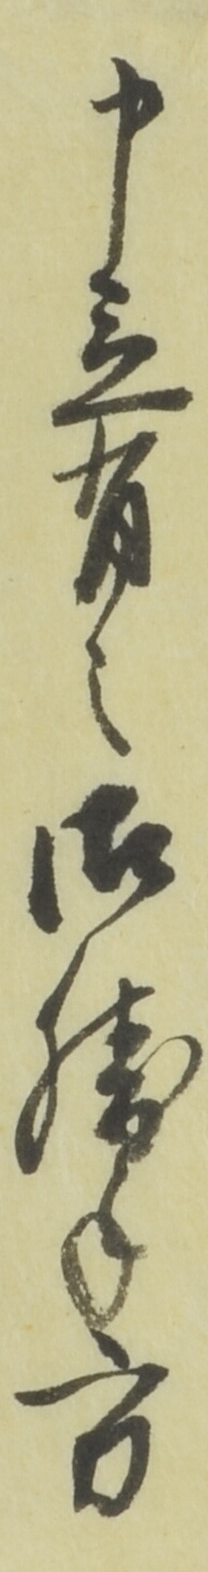申立有之御勝手方
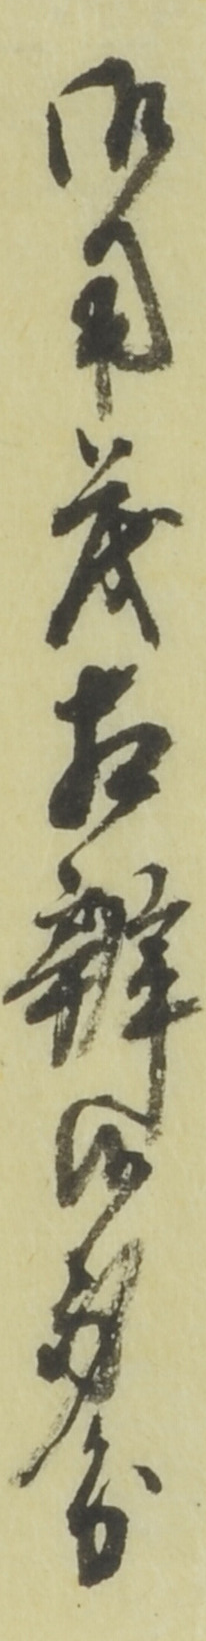御用も相弁候身分
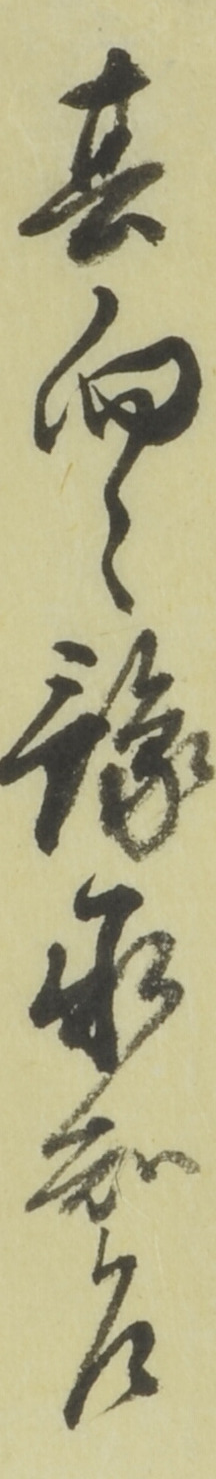其向々豫承知乍
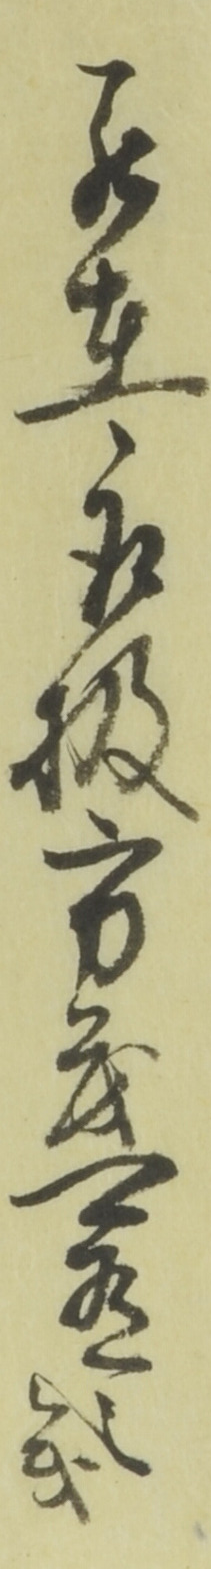罷在取扱方も可有之義
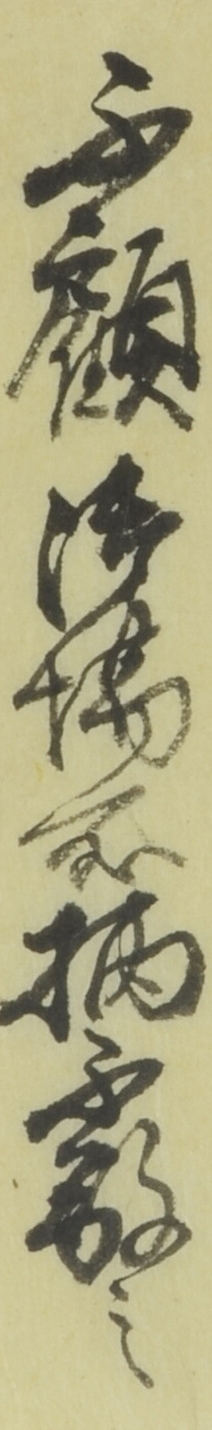不顧御場所柄不敬之

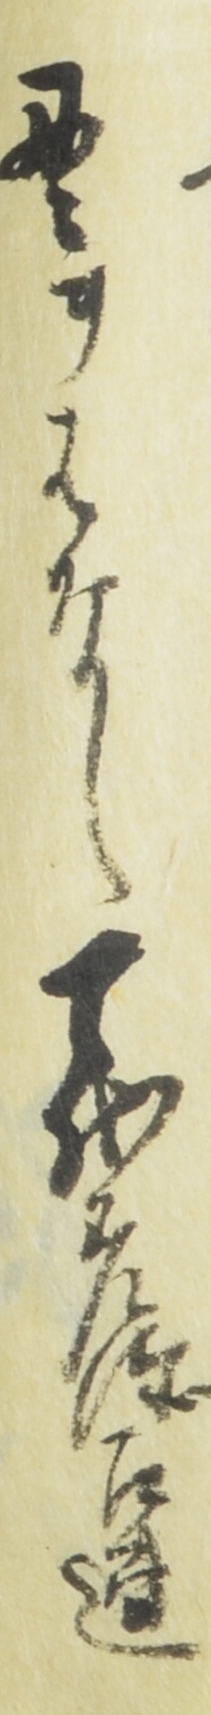貫ヲはなし丁代差添召連
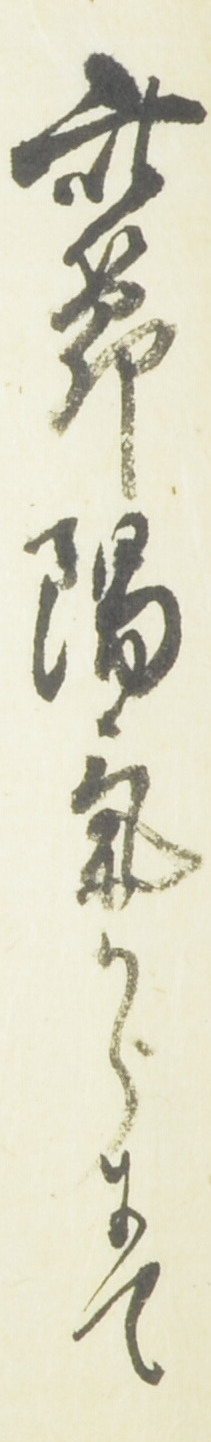此節陽気からにて
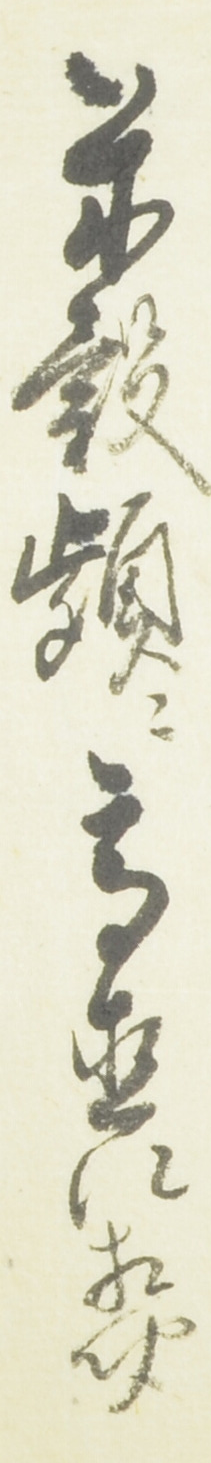米穀頻ニ高直に相聞
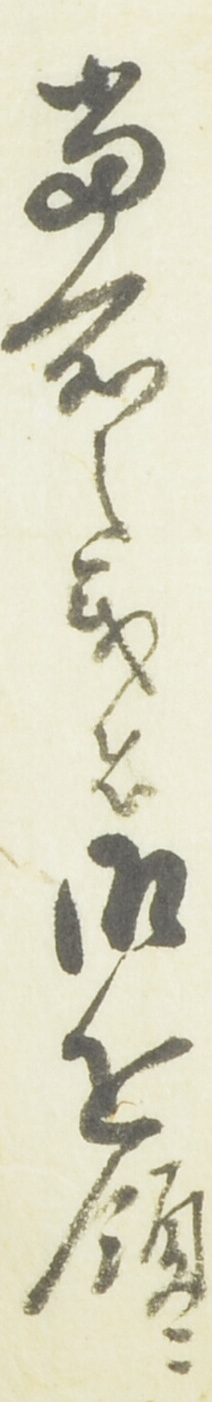当所之義は御近領ニ
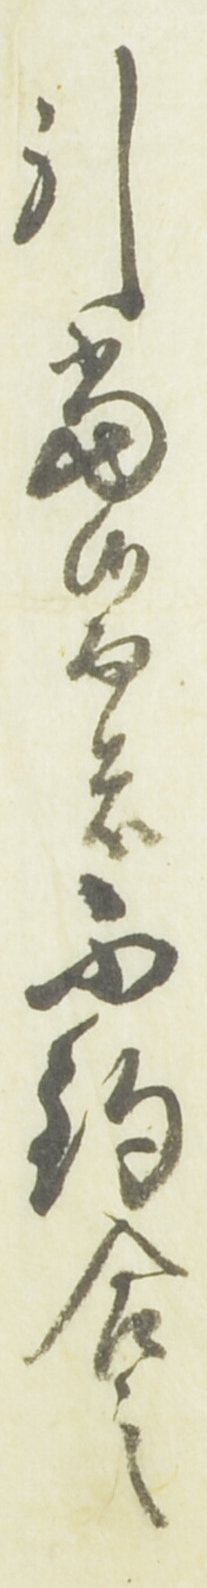引当候而は不釣合之
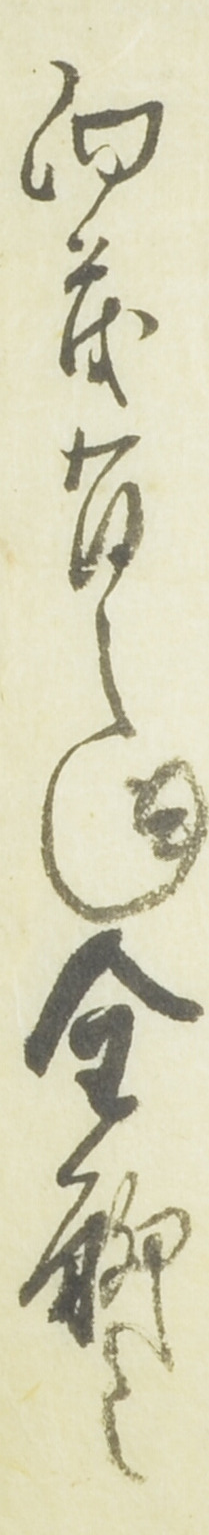向も有之趣全聊
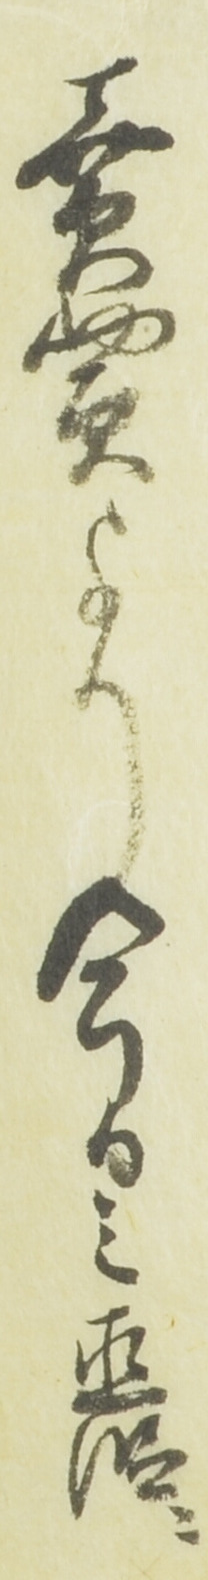売買より今日之直段ニ
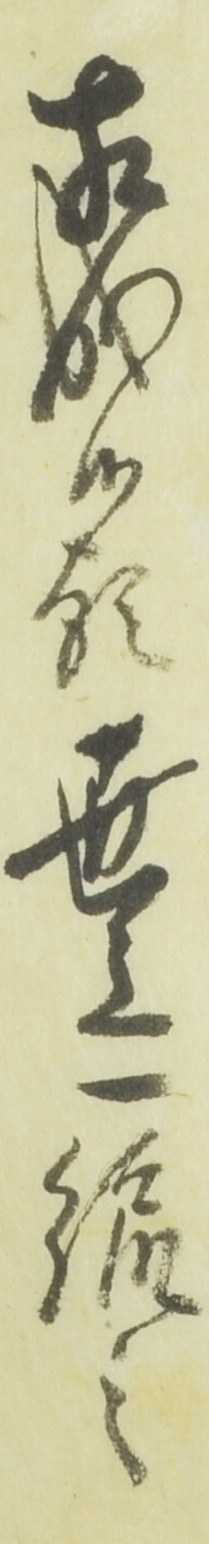相成候歟世上一統之
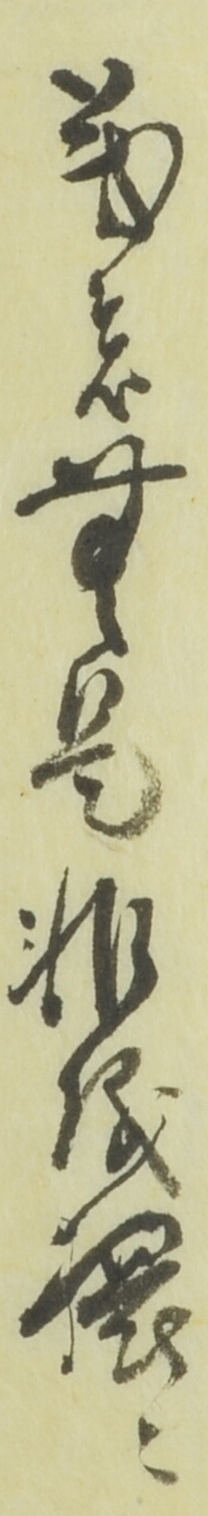義は無是非儀猥ニ
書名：御触書御書附控
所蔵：伊那市立高遠町図書館・合同会社AMANE
